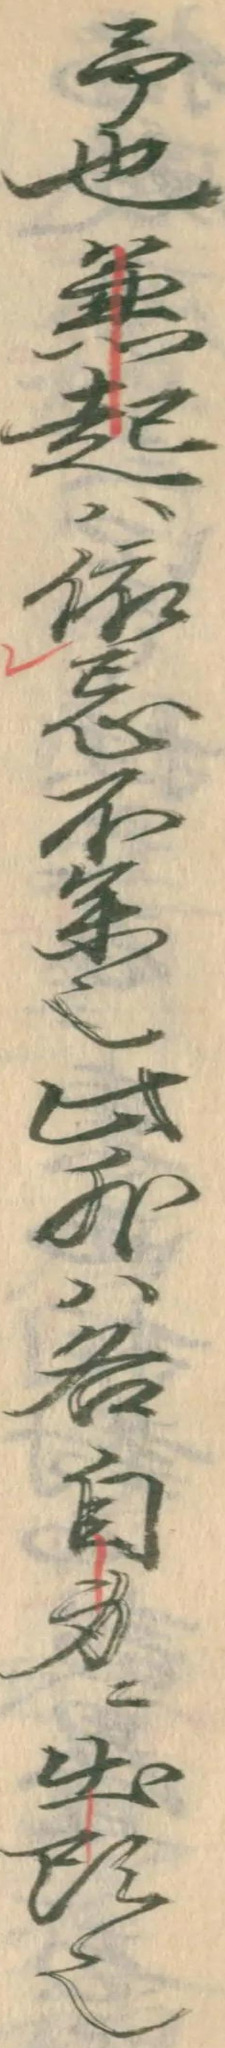予也兼起ハ依忌不参也此外ハ各自-身ニ出頭也
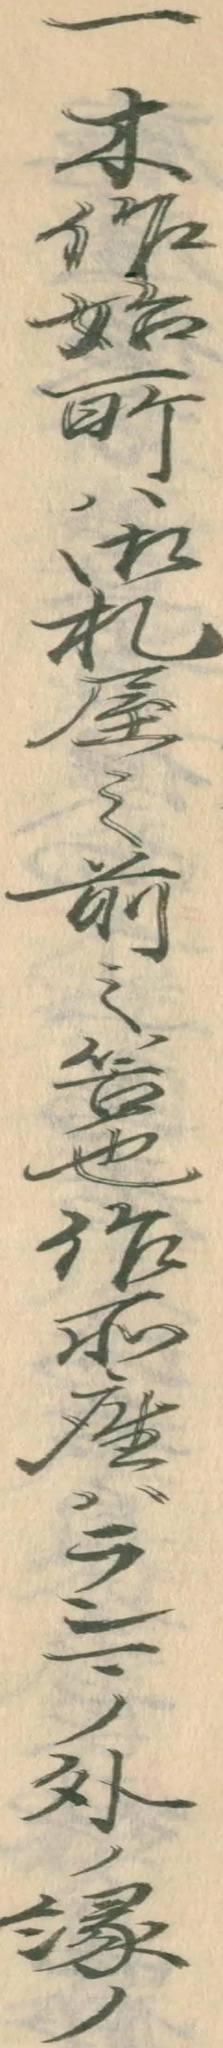一木作始所ハ御札屋之前之筈也作所座ハランマノ外ノ縁ノ
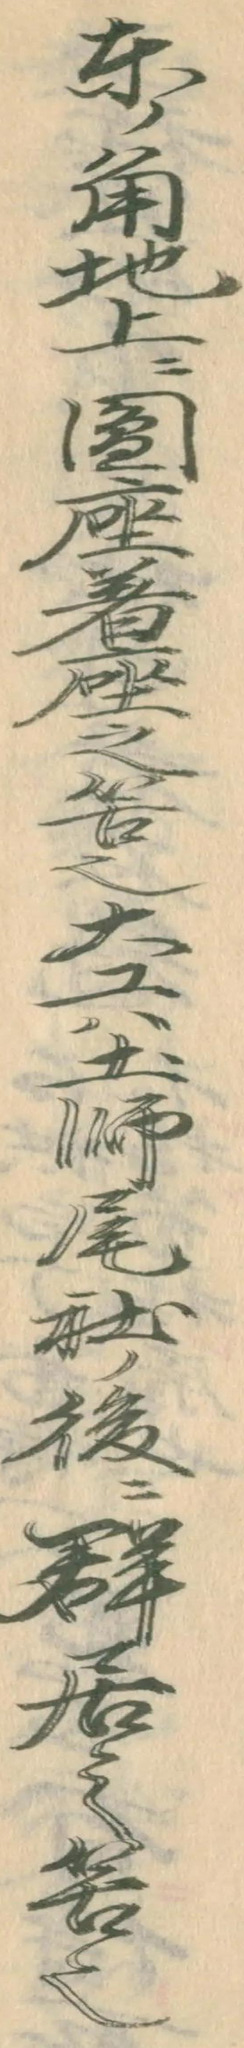東ノ角地上ニ円座着座之筈也大工ハ土師尾社ノ後ニ群居之筈之
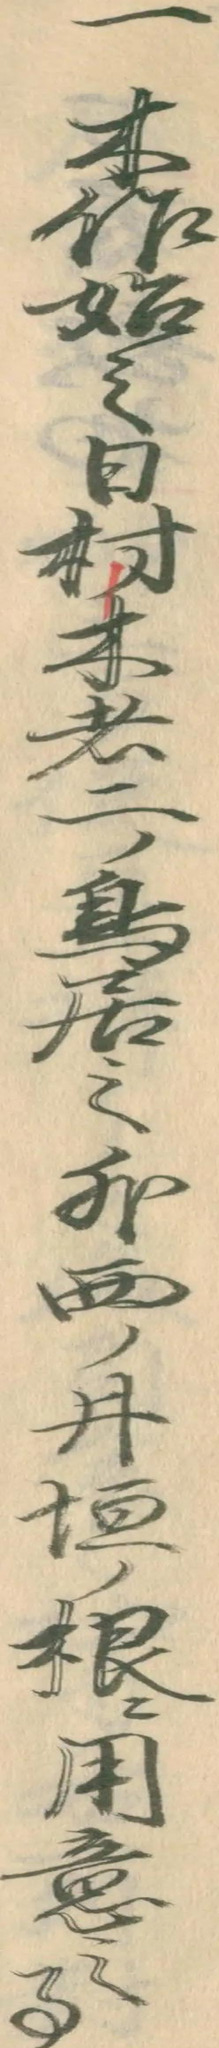一木作始之日材-木者二ノ鳥居之外西ノ井垣ノ根ニ用意之事

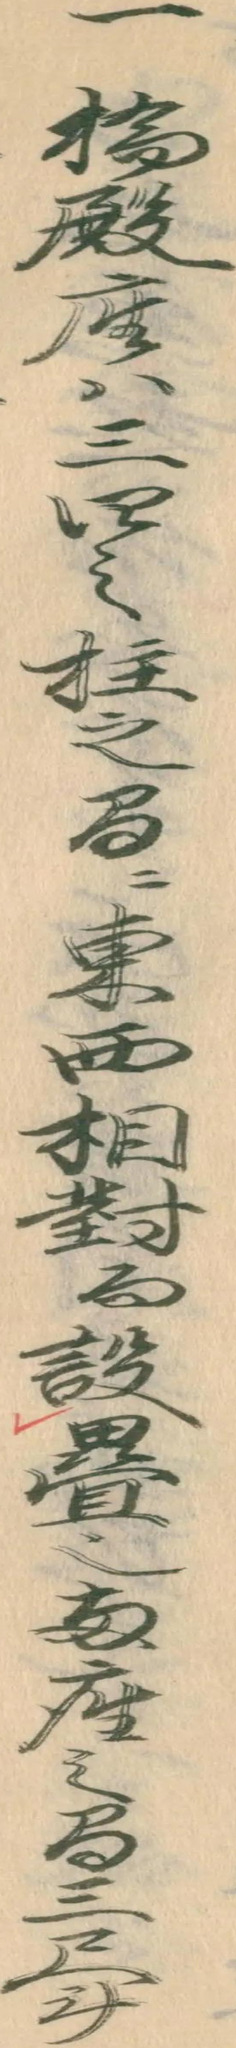一橋殿座ハ三四之柱之間ニ東西相対而設畳也両座之間三尺計

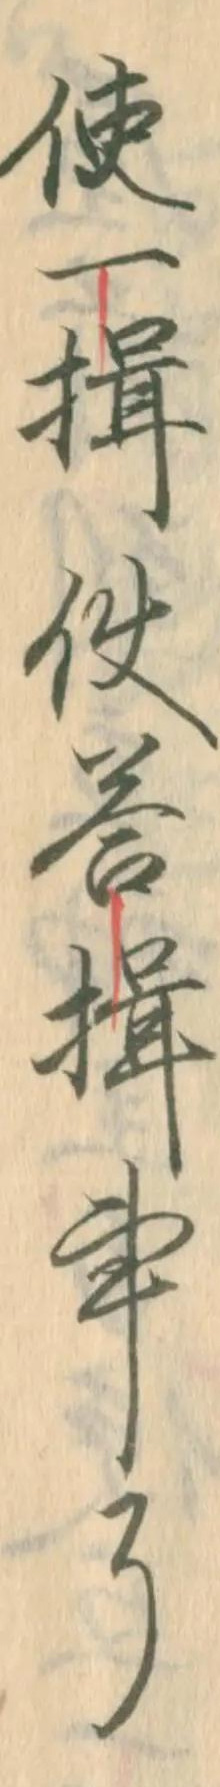使一-揖使答-揖事了
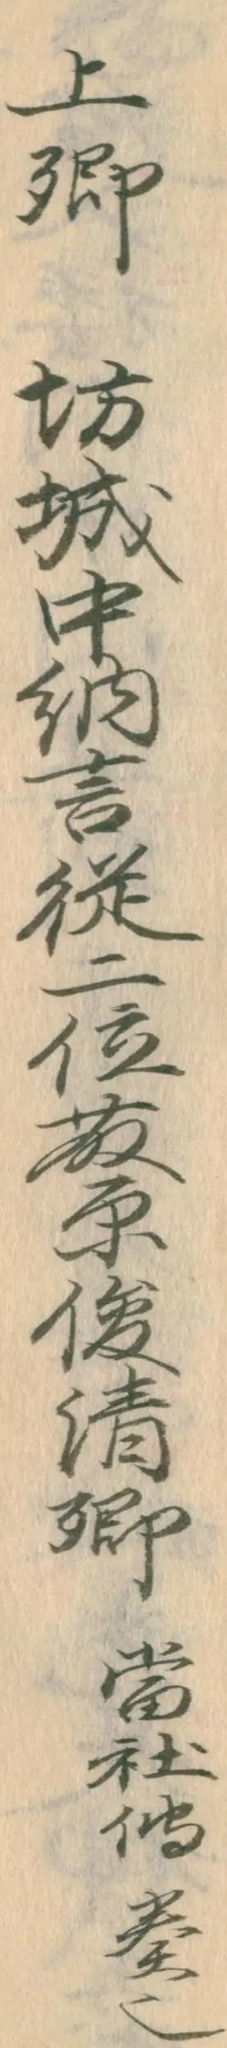上卿坊城中納言従二位藤原俊清卿当社伝奏也
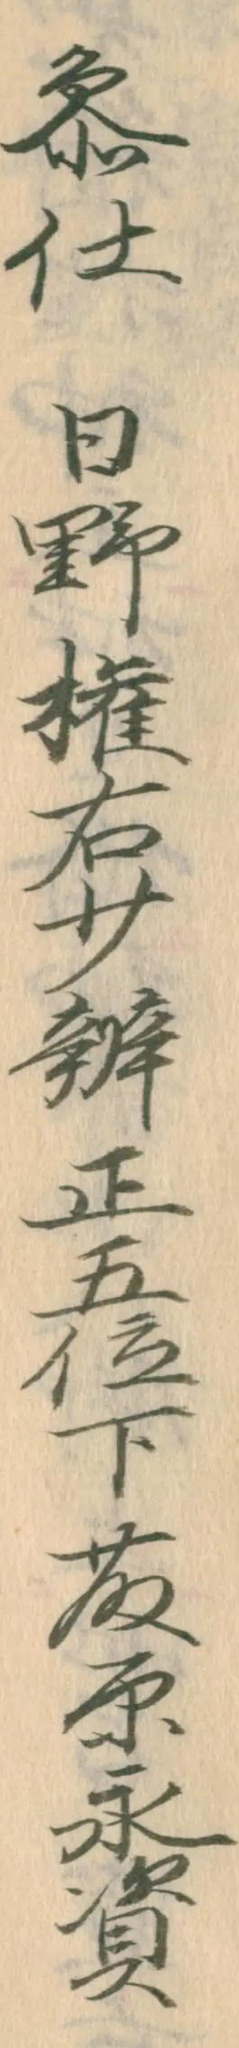参仕日野権右少弁正五位下藤原永資
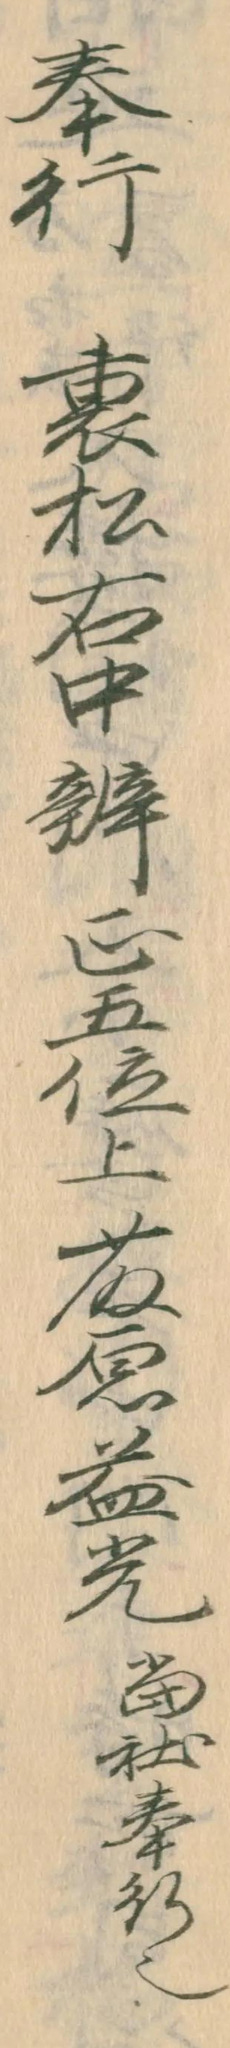奉行裏松右中弁正五位上藤原益光当社奉行也
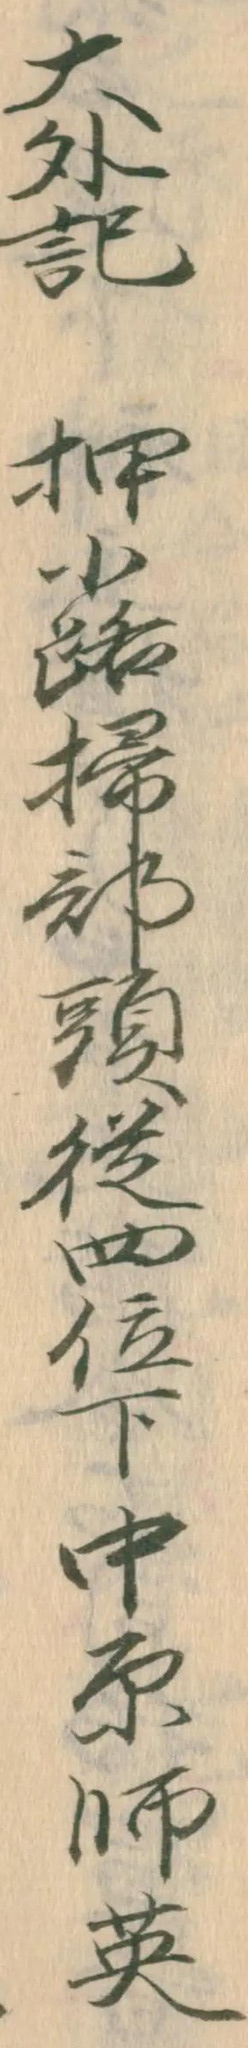大外記押小路掃部頭従四位下中原師英
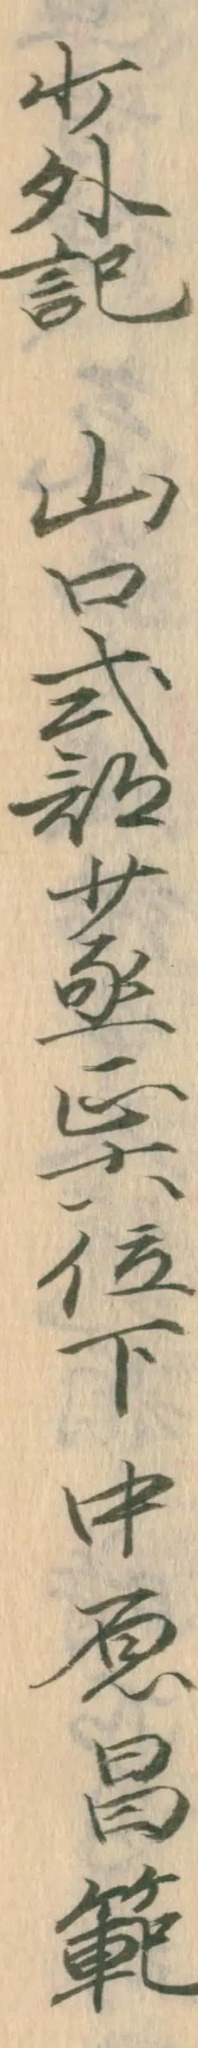少外記山口式部少丞正六位下中原昌範
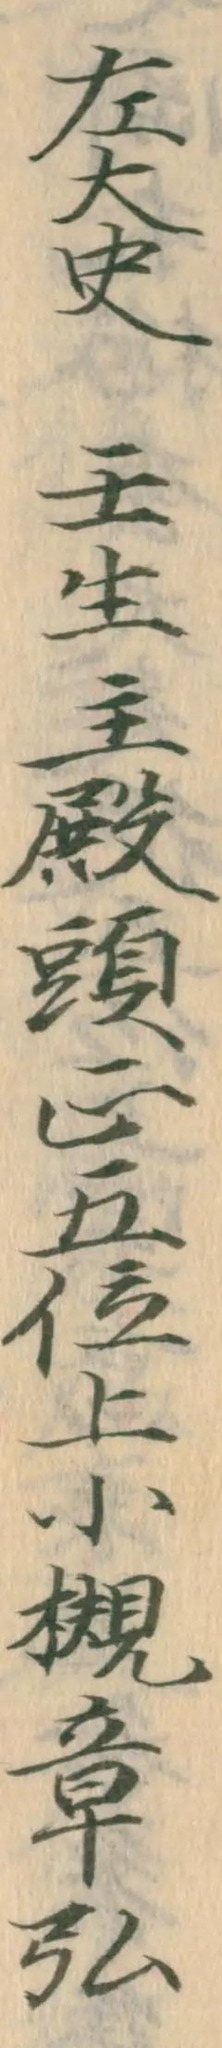左大史壬生主殿頭正五位上小槻章弘
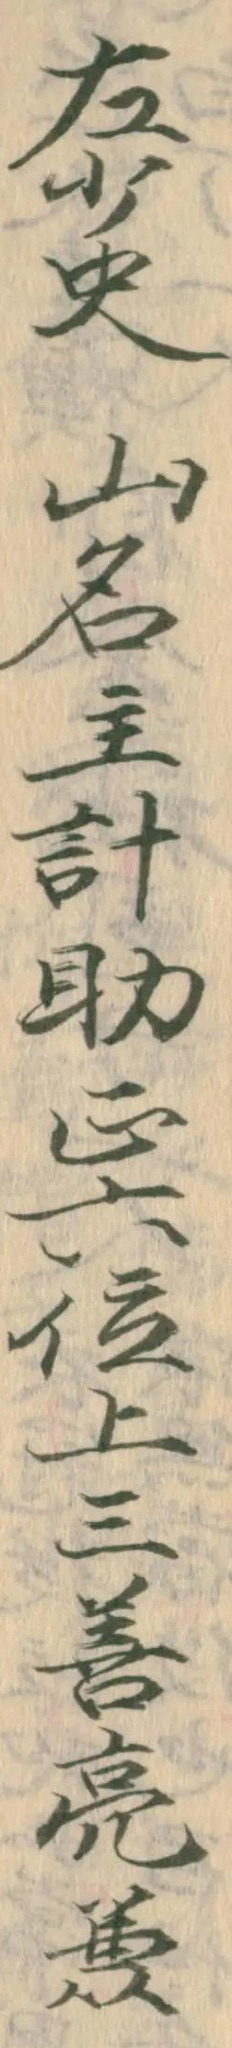左少史山名主計助正六位上三善亮兼
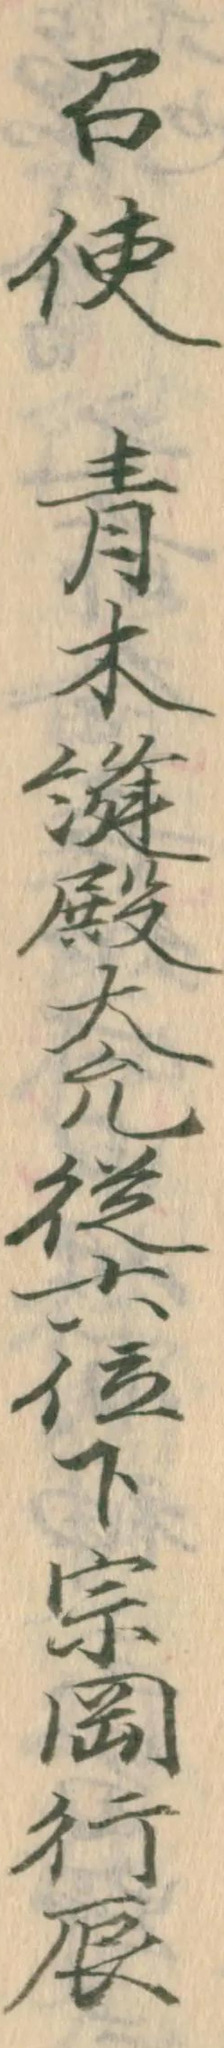召使青木縫殿大允従六位下宗岡行辰
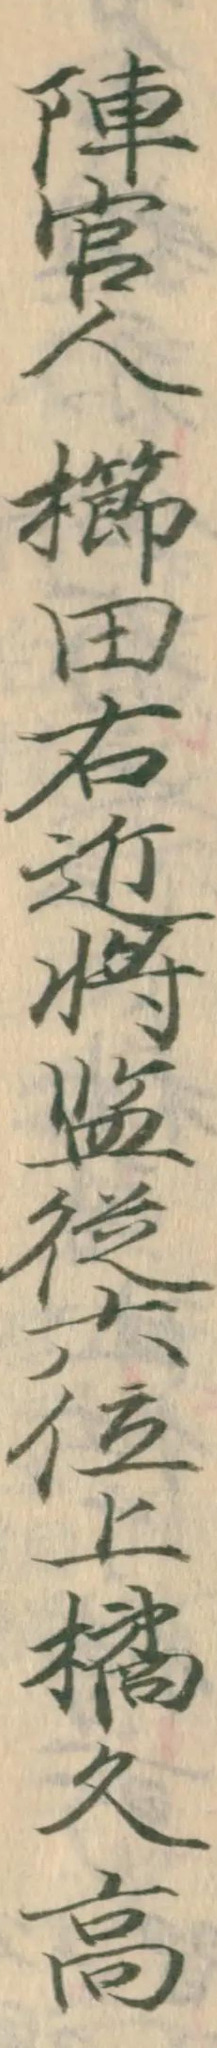陣官人櫛田右近将監従六位上橘久高
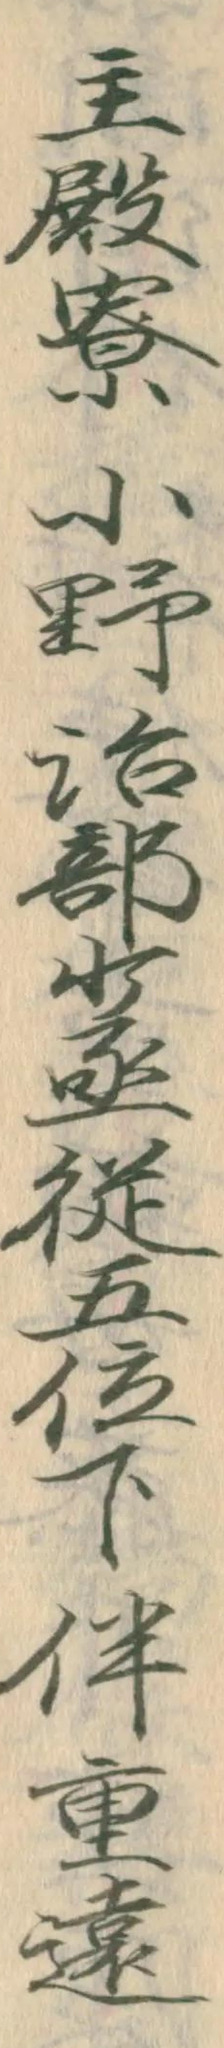主殿寮小野治部少丞従五位下伴重遠
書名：賀茂社記録. 第15冊
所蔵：国立国会図書館 National Diet Library, JAPAN
